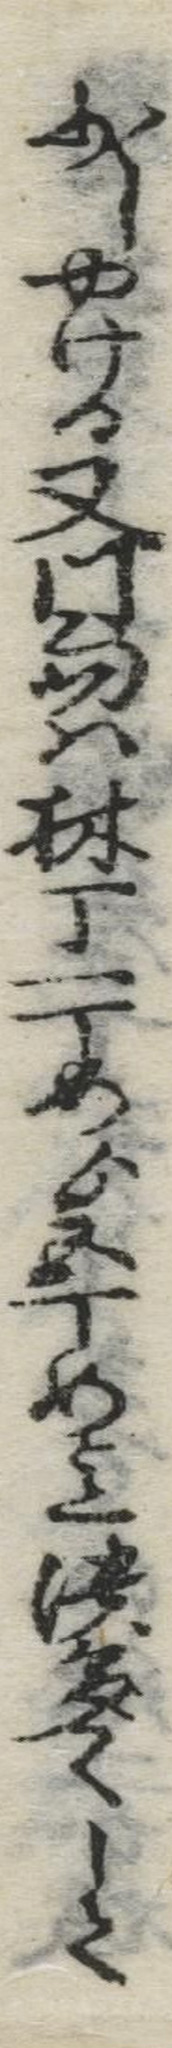少しやける又川向ハ林丁一丁めゟ五丁め迄潰多くして
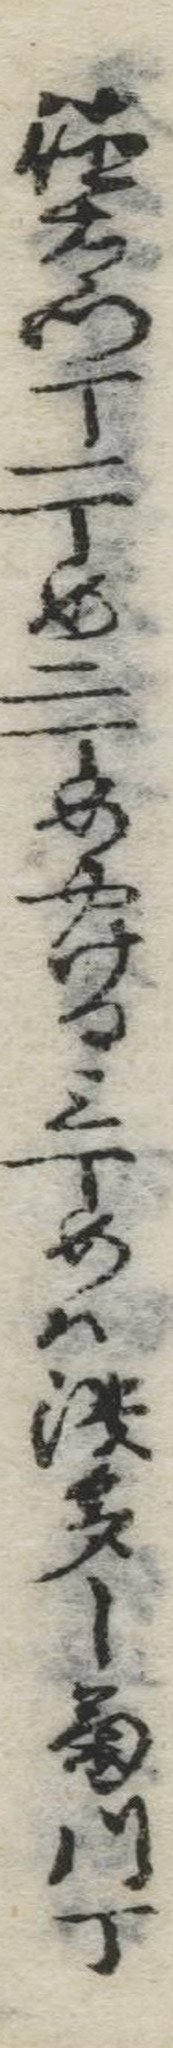徳右衛門丁一丁め二丁めやける三丁目ハ潰多し菊川丁
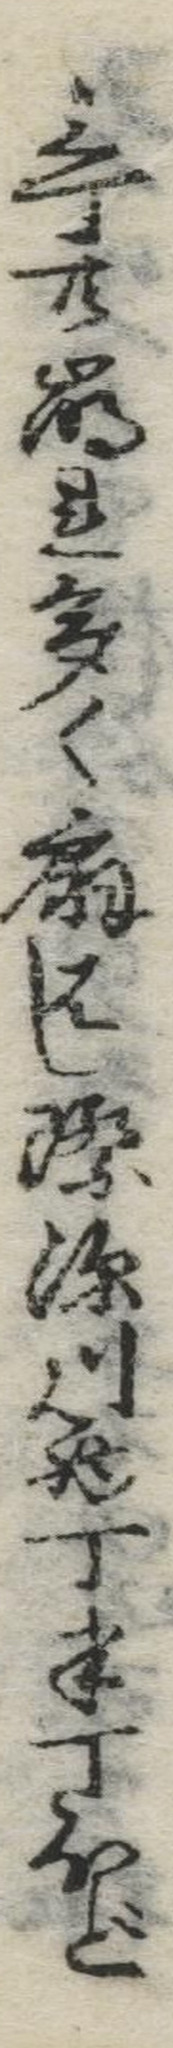三丁共崩れ多く扇はし際深川西丁半丁ほど
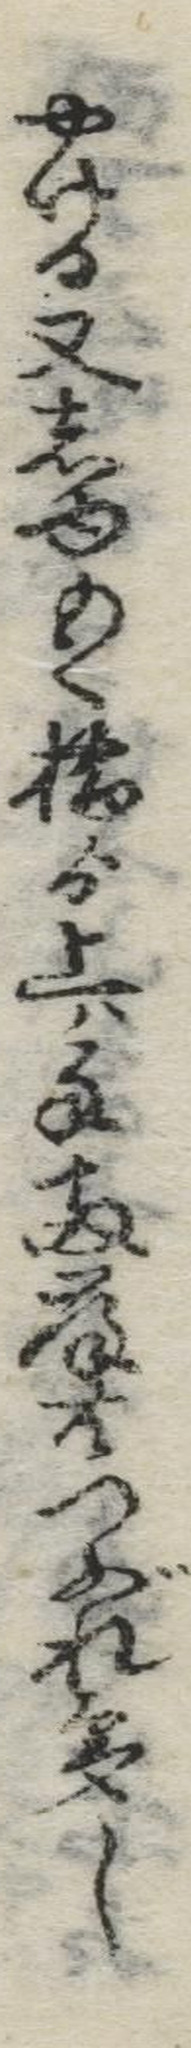やける又しゆもく橋ゟ上ハ上ハ手両岸共つぶれ多し
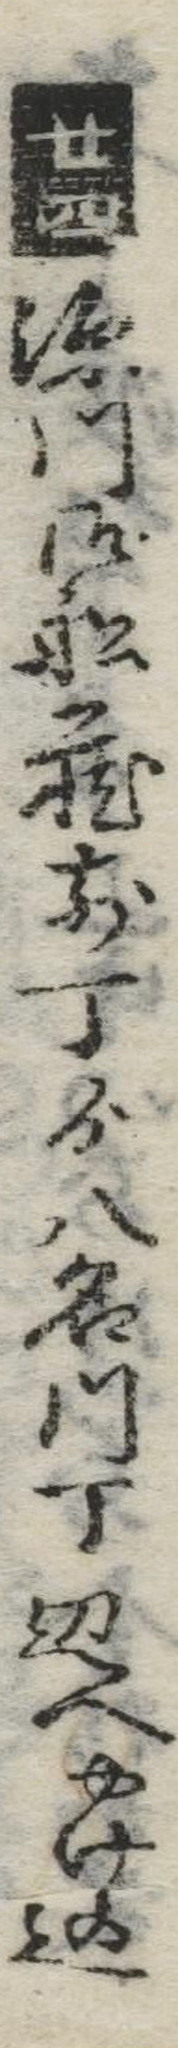廿四深川御船蔵前ゟ八名川丁辺へやけ込
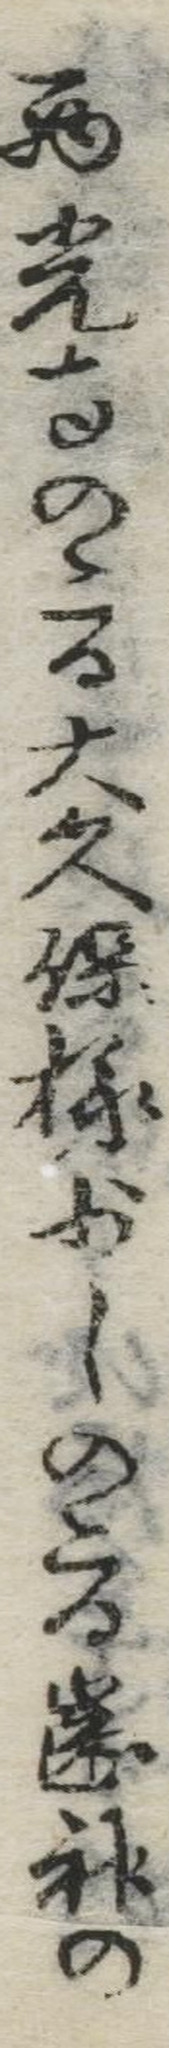西光寺のこる大久保様少しのこる歯神の
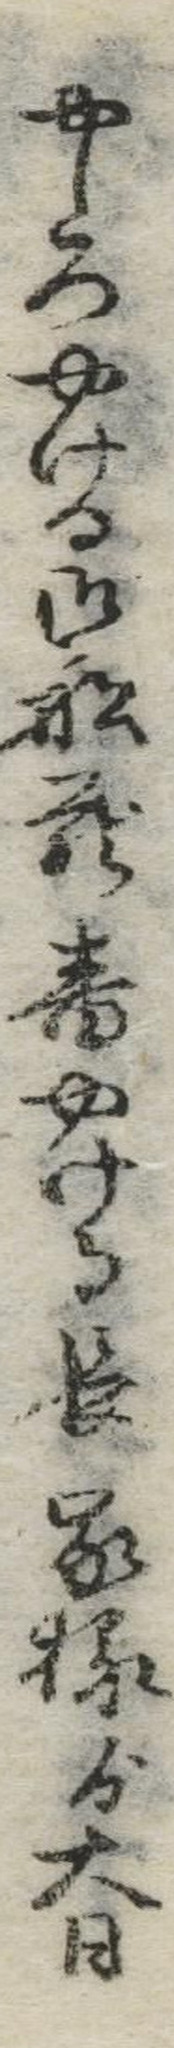やしろやける御船蔵番やける長家様ゟ大日
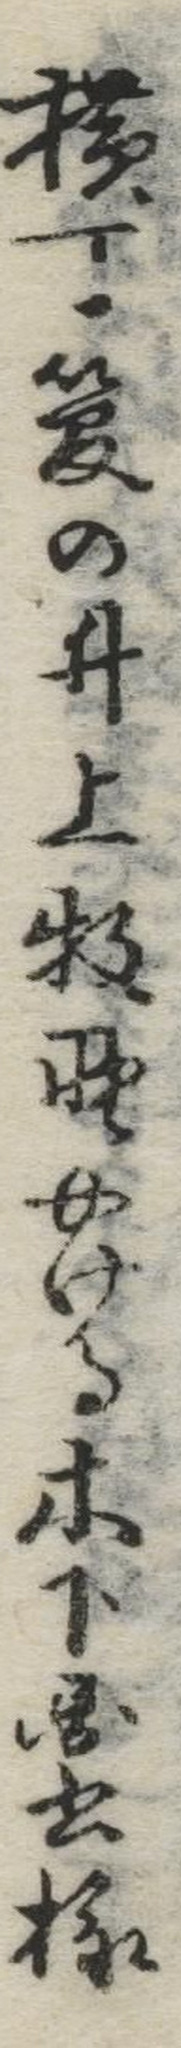横丁菅の井上牧野やける木下圖書様
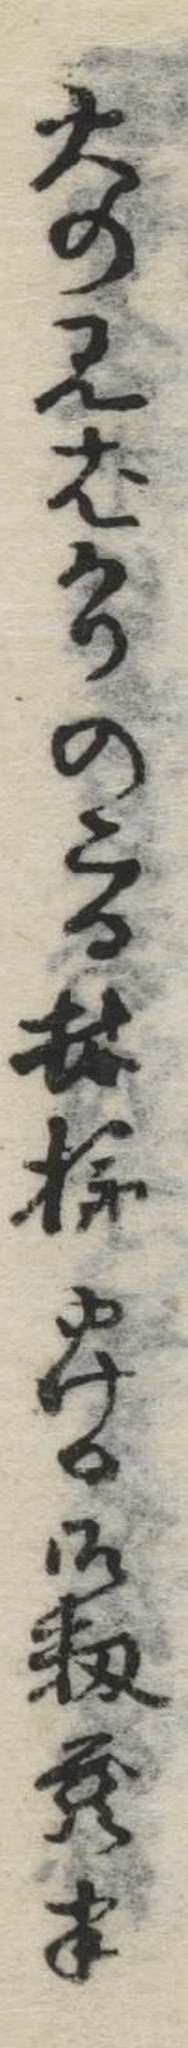火の見はかりのこる林様やける御籾蔵半

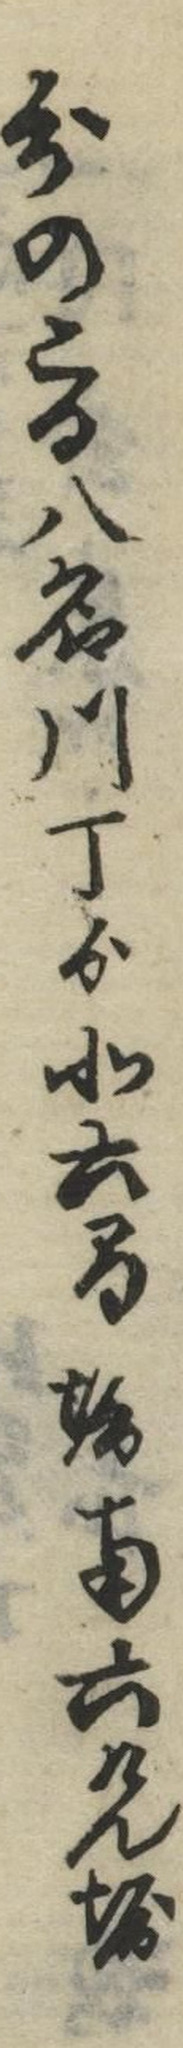分のこる八名川丁ゟ北六間堀南六間堀
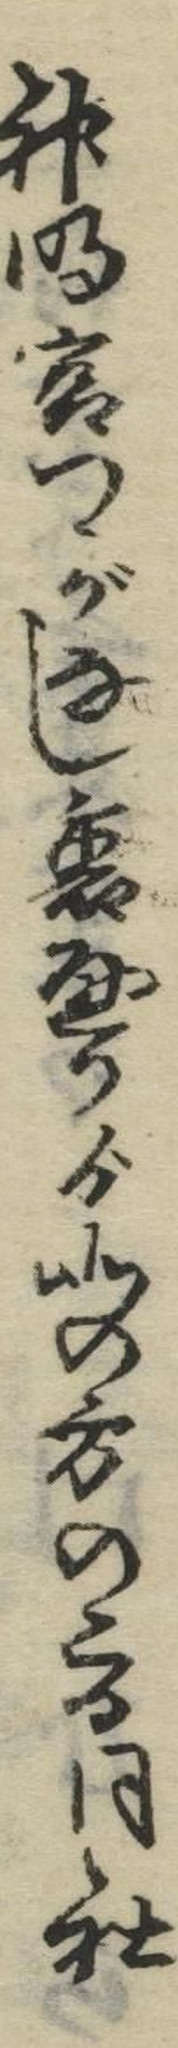神明宮つゝがなし裏通りゟ北の方のこる同社
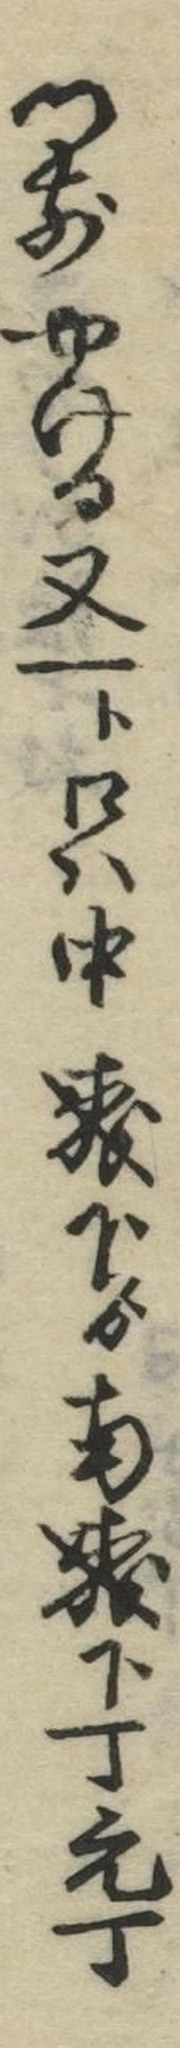門前やける又一ㇳ口ハ中森下ゟ南森下丁元丁
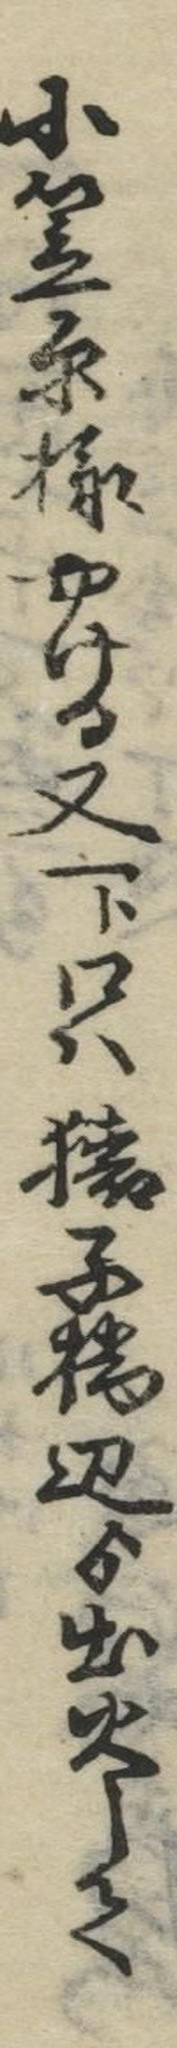小笠原様やける又一ㇳ口ハ猿子橋辺ゟ出火して
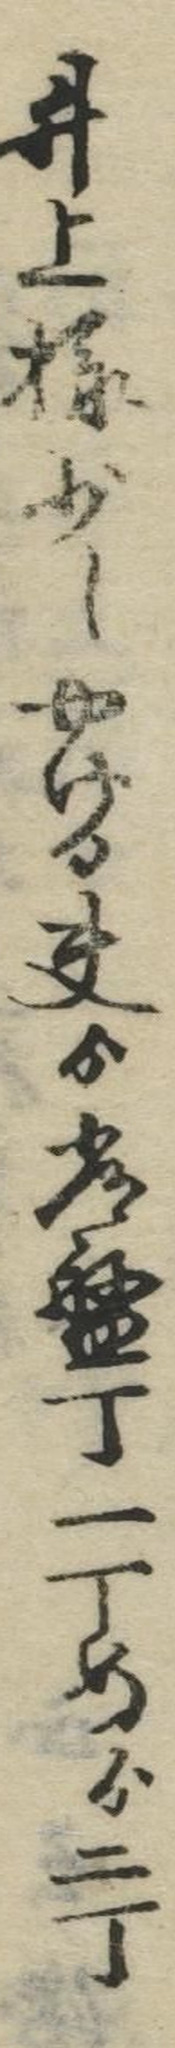井上様少しやける夫ゟ常盤丁一丁めゟ二丁
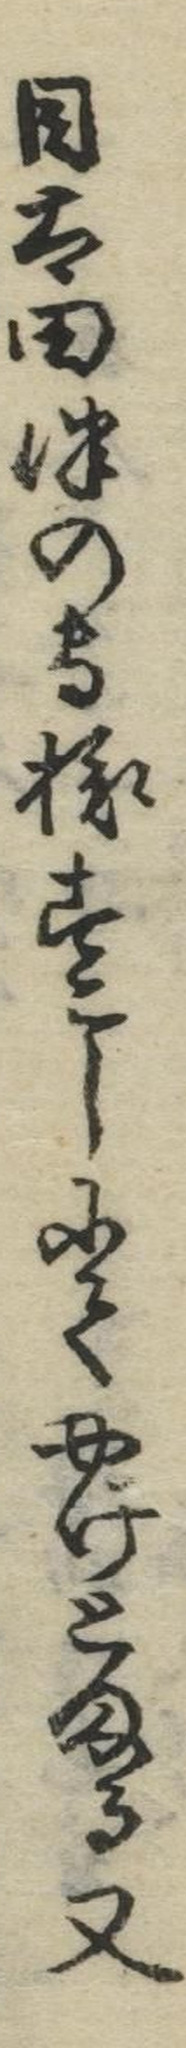目太田津の守様すこしにてやけとまる又
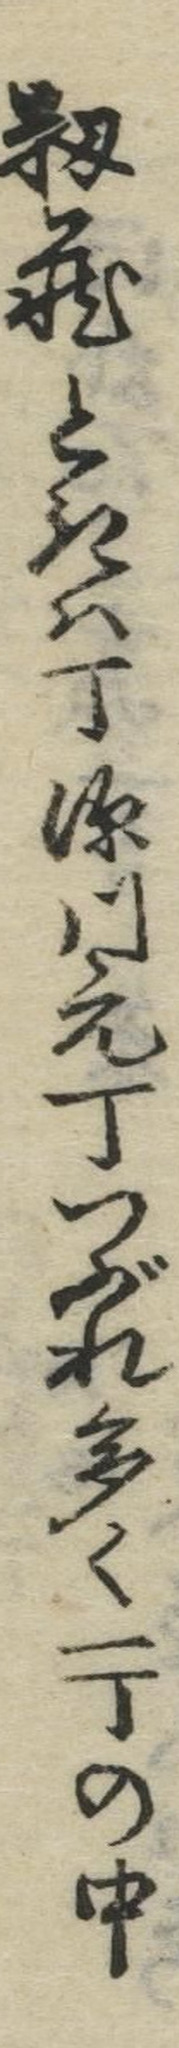籾蔵ときハ丁深川元丁つぶれ多く一丁の中
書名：安政二卯十月二日夜四ツ時過　御府内御屋敷方市中共　地震類焼場所明細書之寫　并街道筋近郷聞書
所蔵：東京大学地震研究所図書室 Earthquake Research Institute Library, The University of Tokyo, JAPAN
